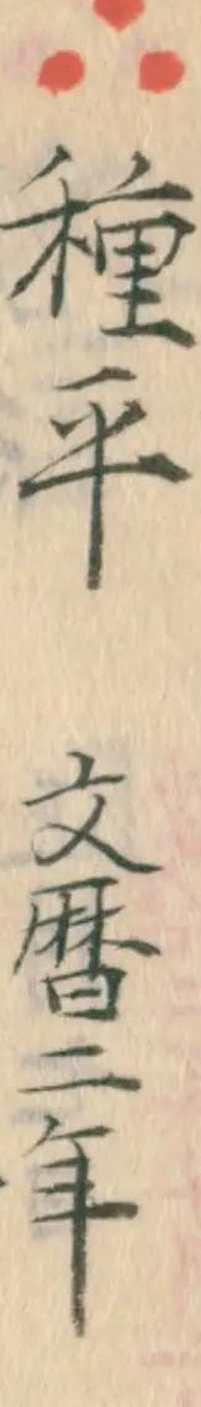∴種平文暦二年
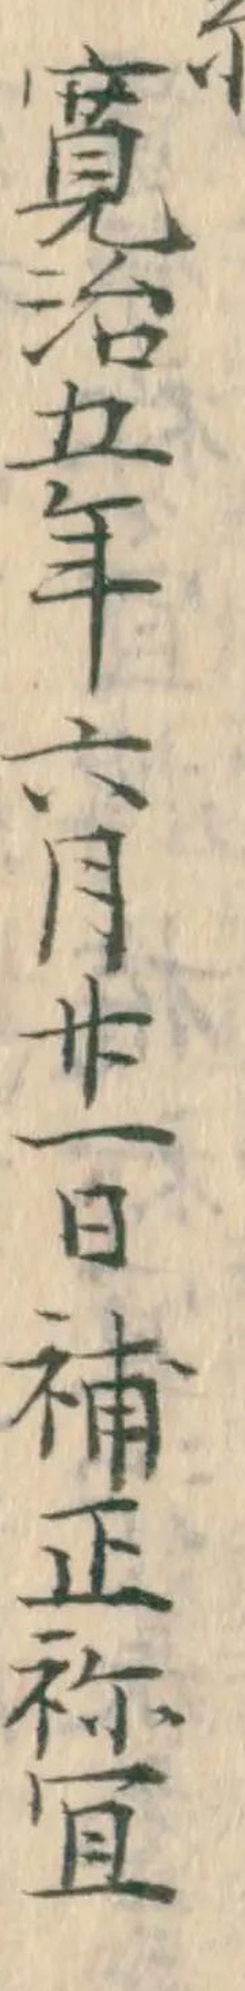安成寛治五年六月廿一日補正祢宜
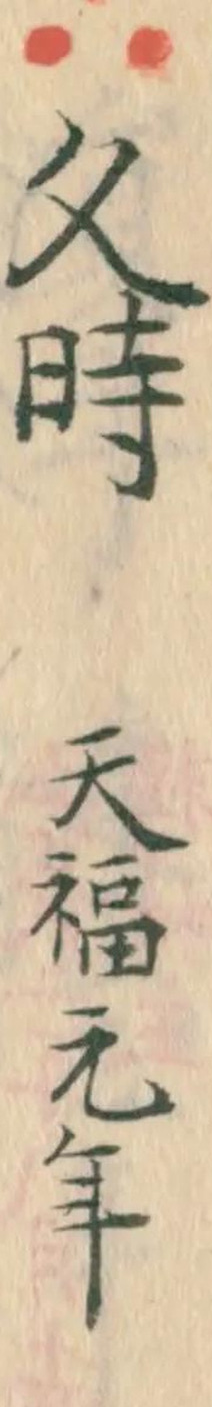∴久時天福元年
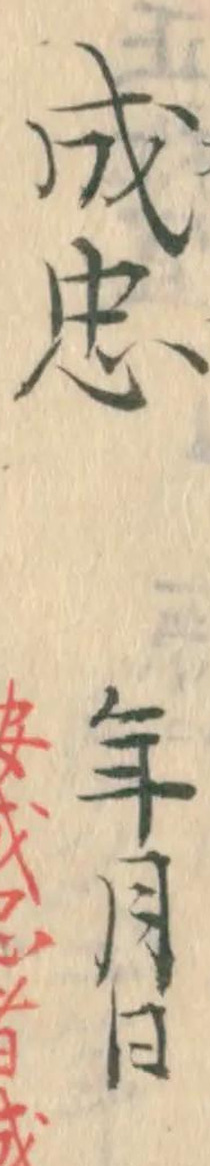成忠年月日
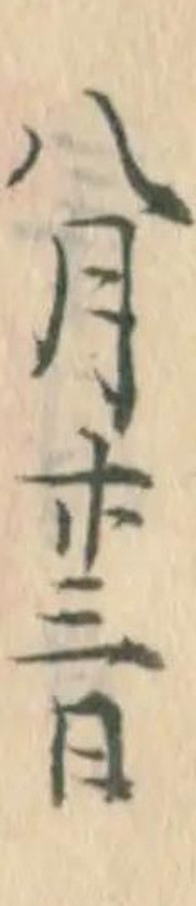六月廿二日

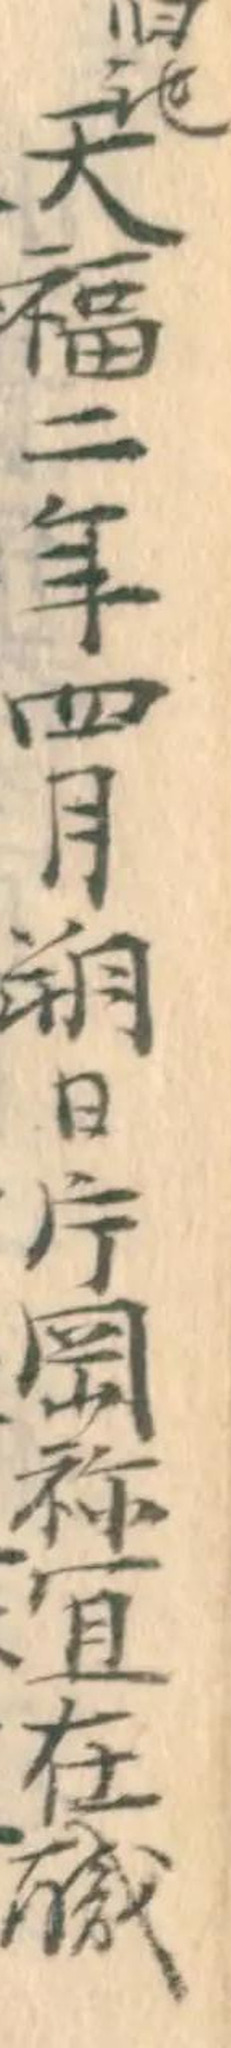天福二年四月朔日片岡祢宜在職
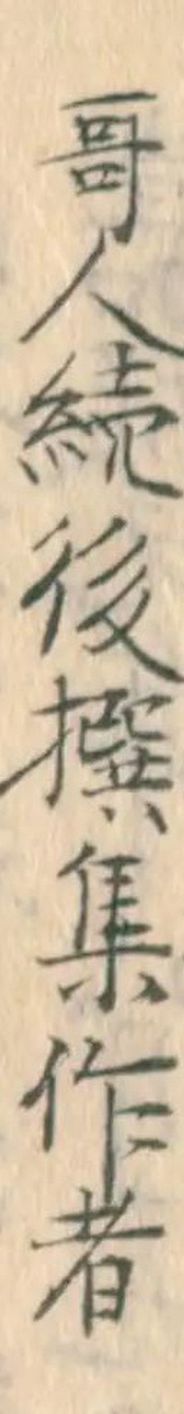哥人続後撰集作者
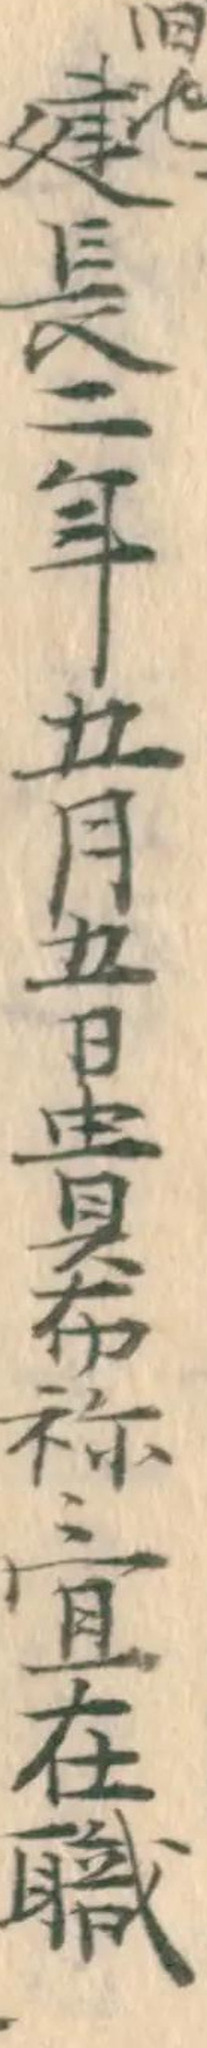建長二年五月五日貴布祢々宜在職
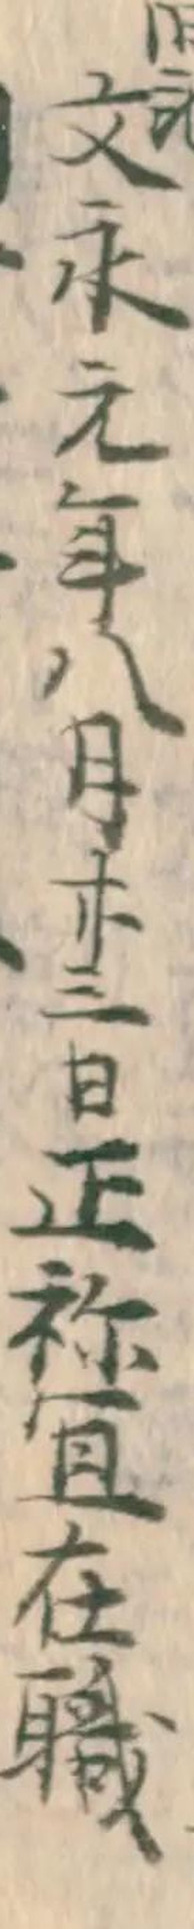文永元年八月廿三日正祢宜在職
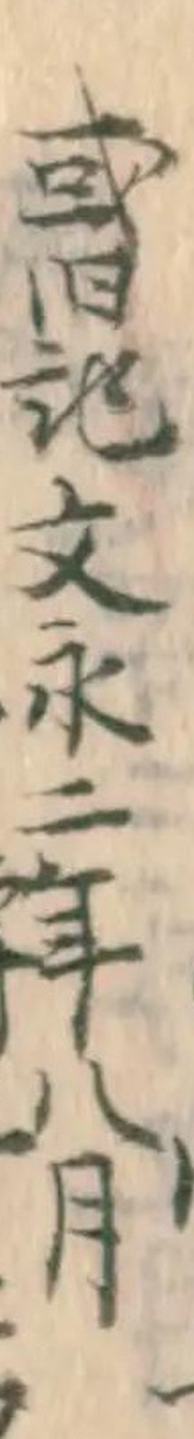或旧記文永二年八月
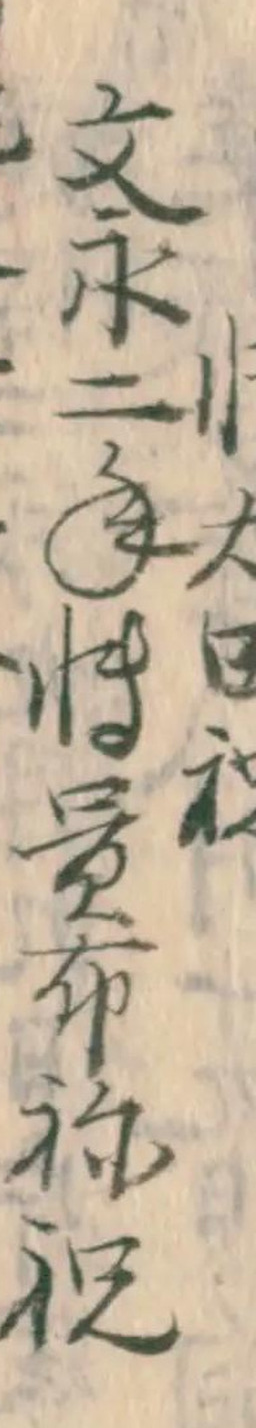文永二年転貴布祢祝
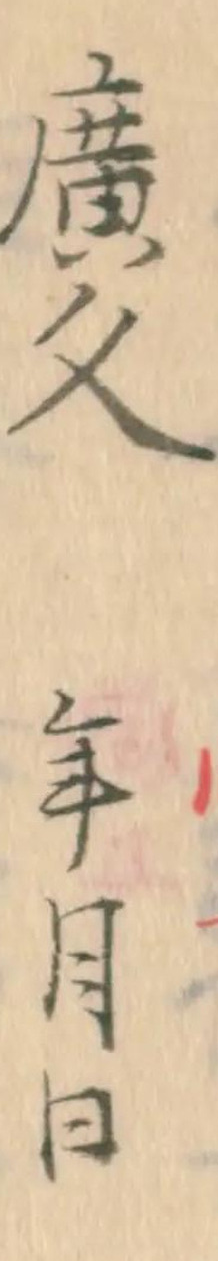廣久年月日
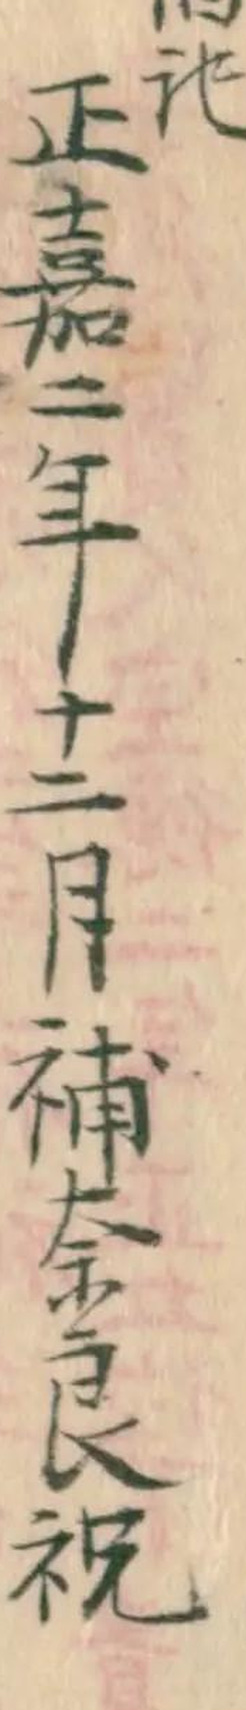正嘉二年十二月補奈良祝
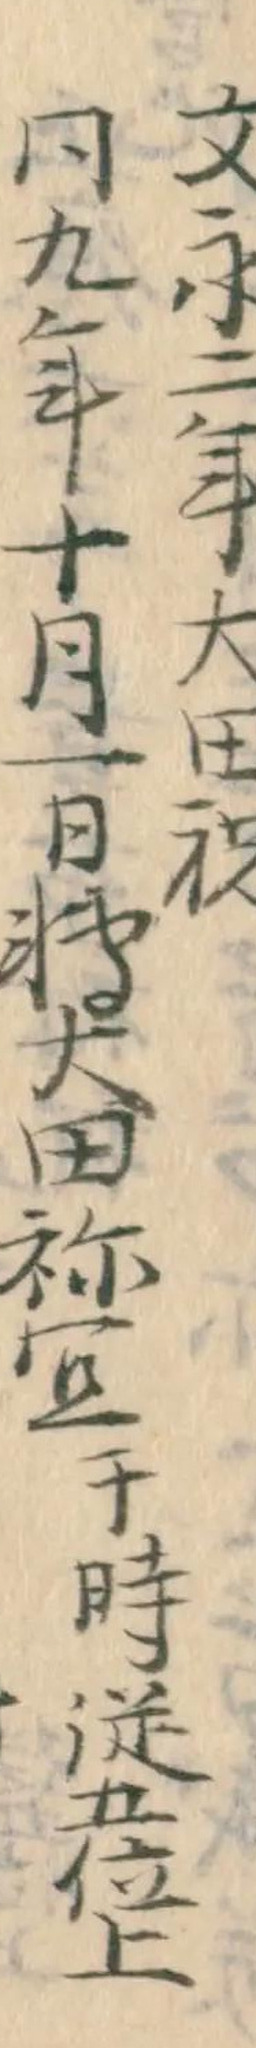同九年十月一日転大田祢宜于時従五位上
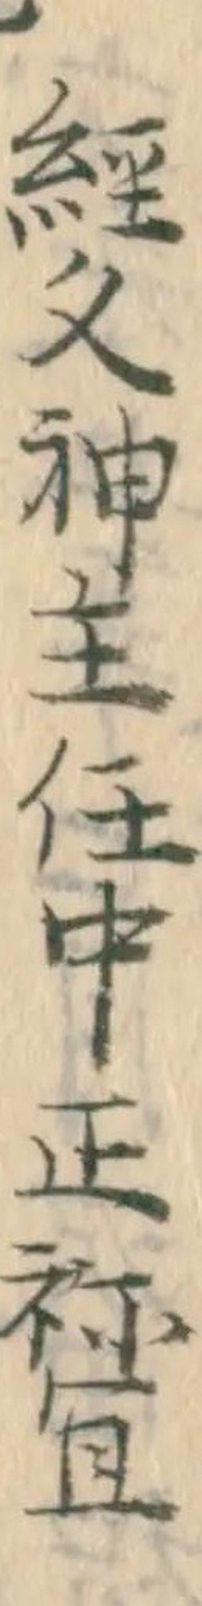経久神主任中正祢宜
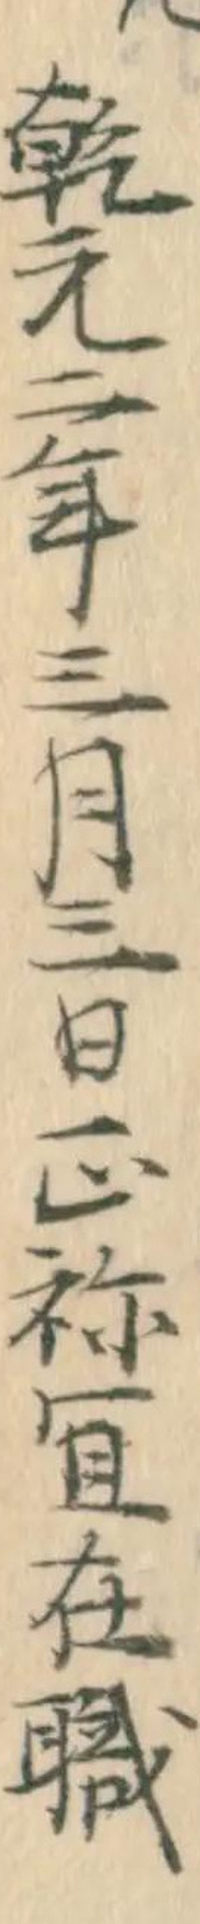乾元二年三月三日正祢宜在職
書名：賀茂社記録. 第23冊
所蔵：国立国会図書館 National Diet Library, JAPAN
